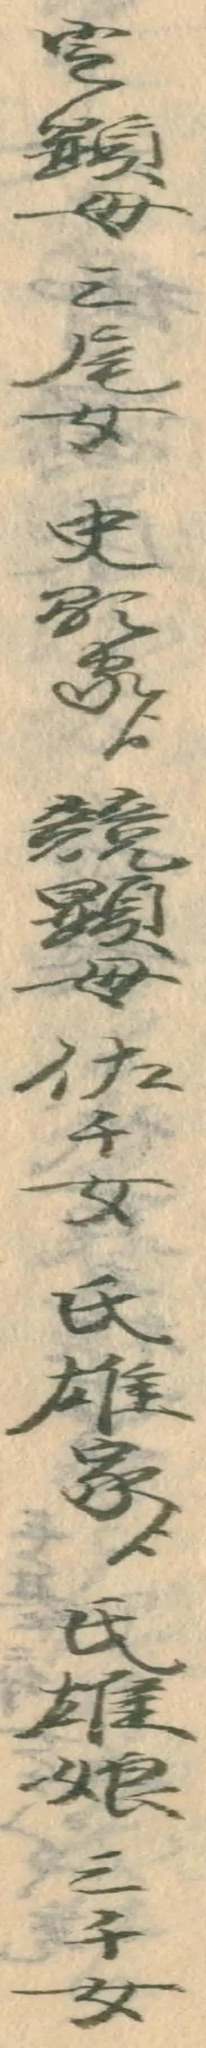定顕母みを女史顕家ゟ競顕母さち女氏雄家ゟ氏雄娘みち女
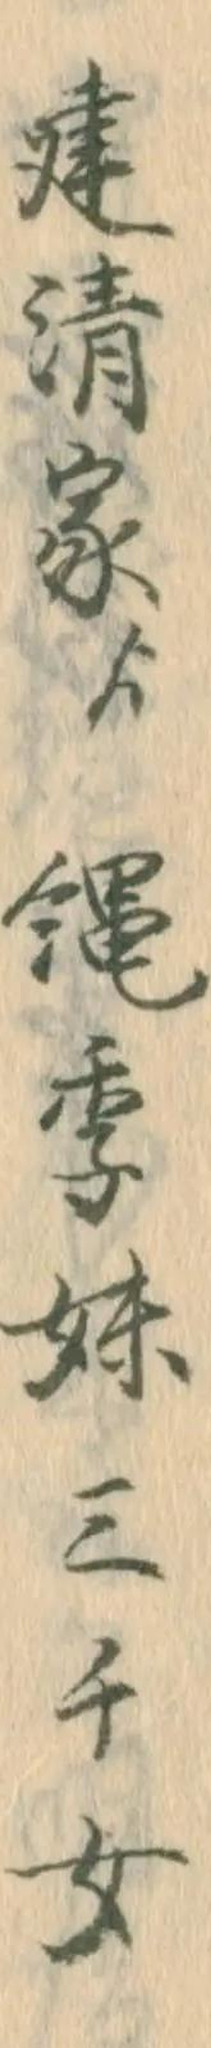建清家ゟ縄季妹みち女

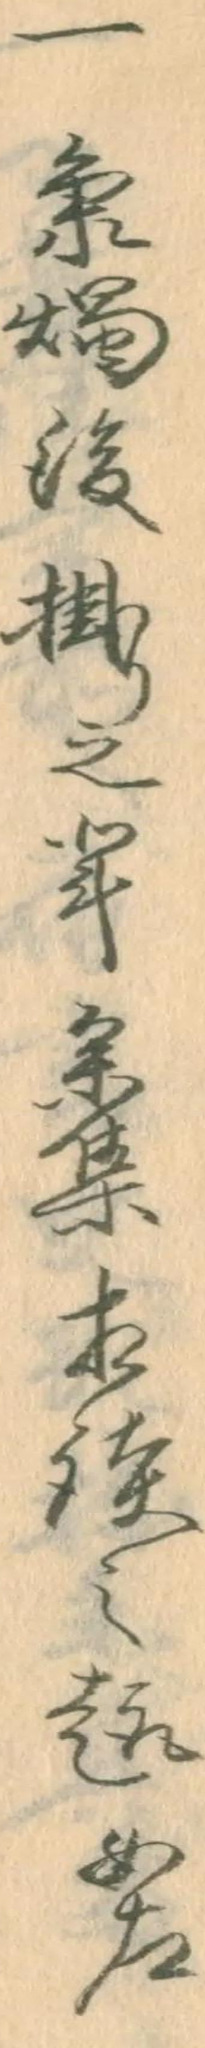一秉燭後掛り之輩参集相談之趣如左
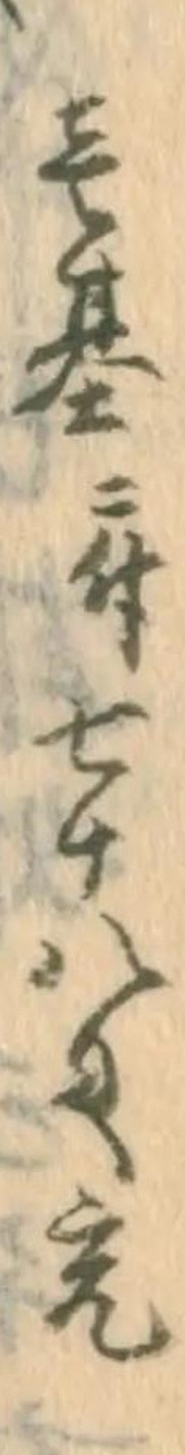壱基ニ付七十八匁充
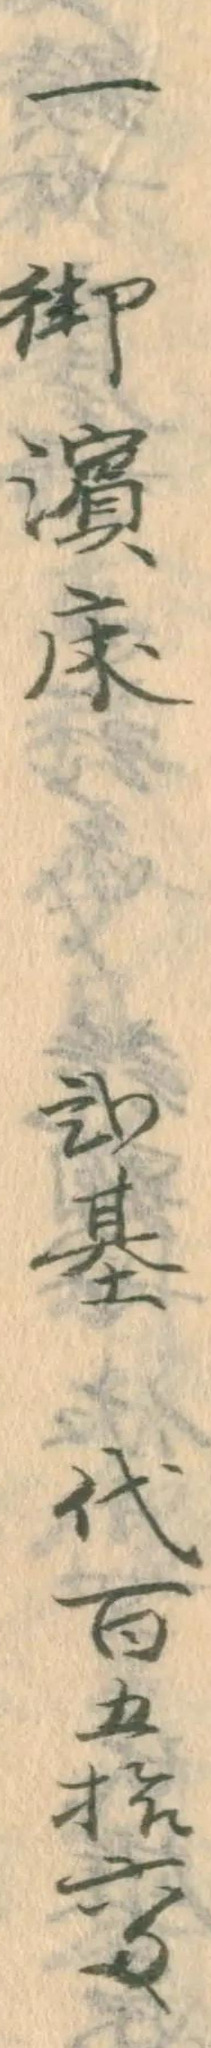一御浜床弐基代百五拾六匁
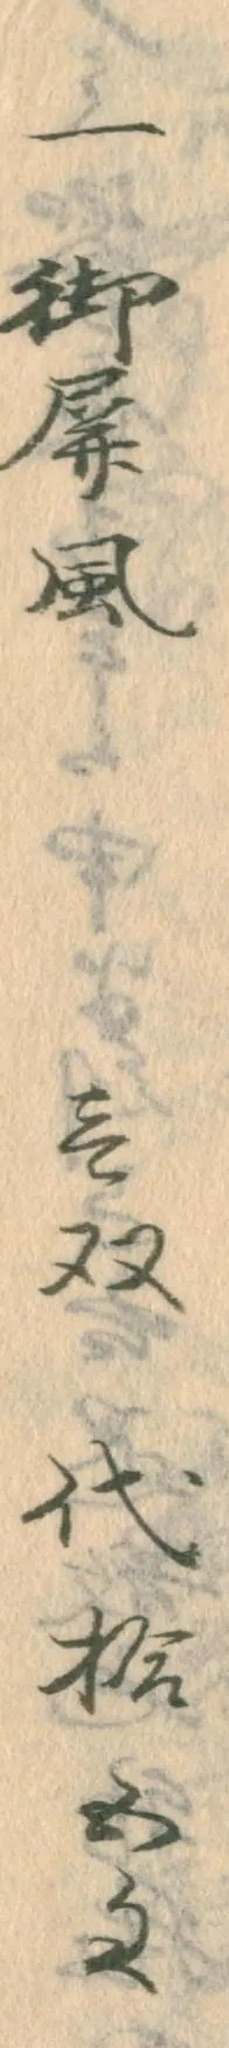一御屏風壱双代拾五匁
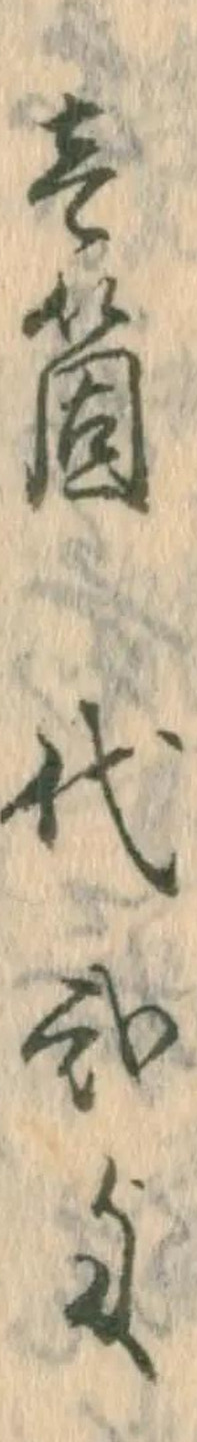一同壱箇代弐匁
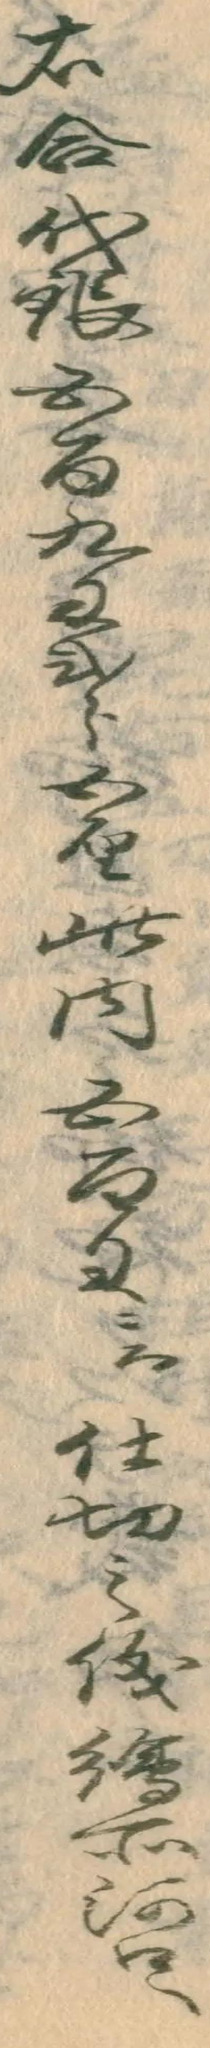右合代銀五百九匁弐分五厘此内五百匁ニ而仕切之儀絵所河口へ
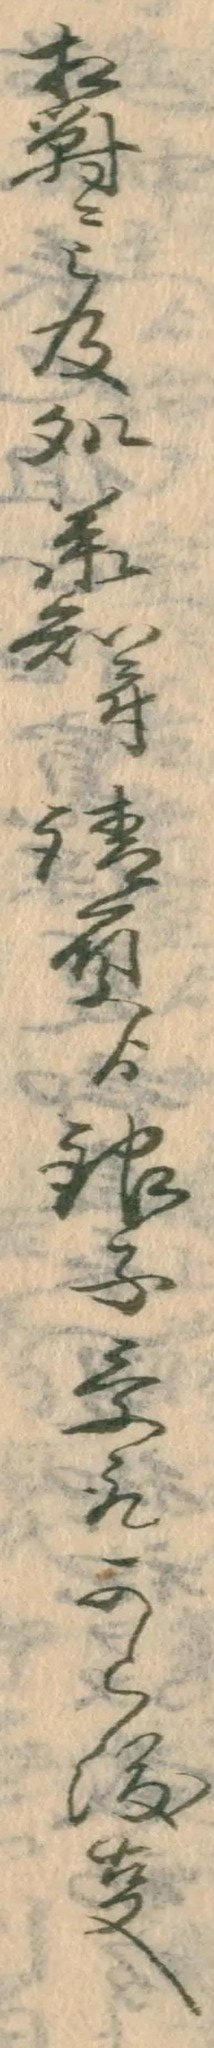相対ニ被及処承知ニ付請負ゟ銀子受取可申渡事
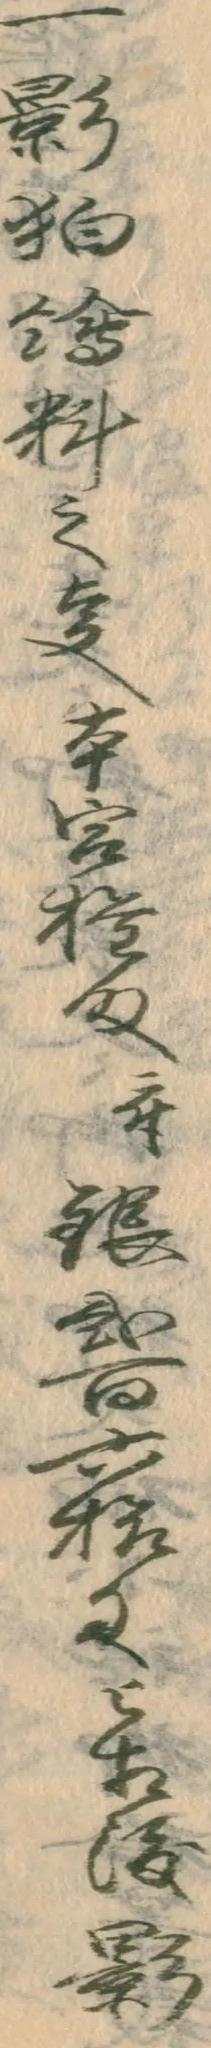一影狛絵料之事本宮権殿ニ付銀弐百六拾匁被相渡影
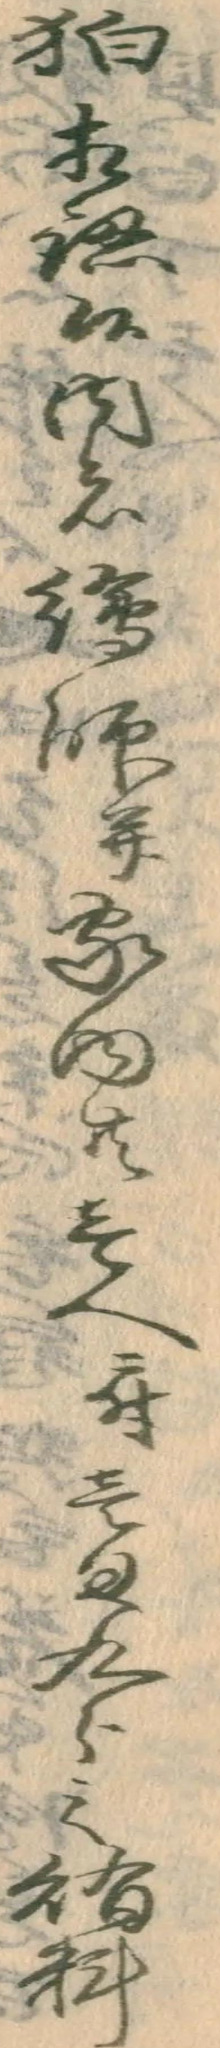狛相認候内は絵師并家内共壱人ニ付壱匁九分之賄料
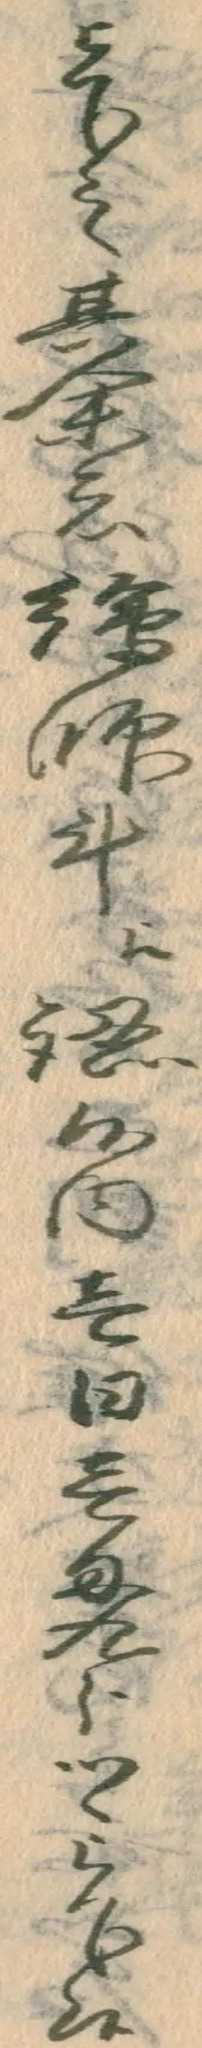被下之其余は絵師斗江認候内壱日壱匁九分ツヽ被下候
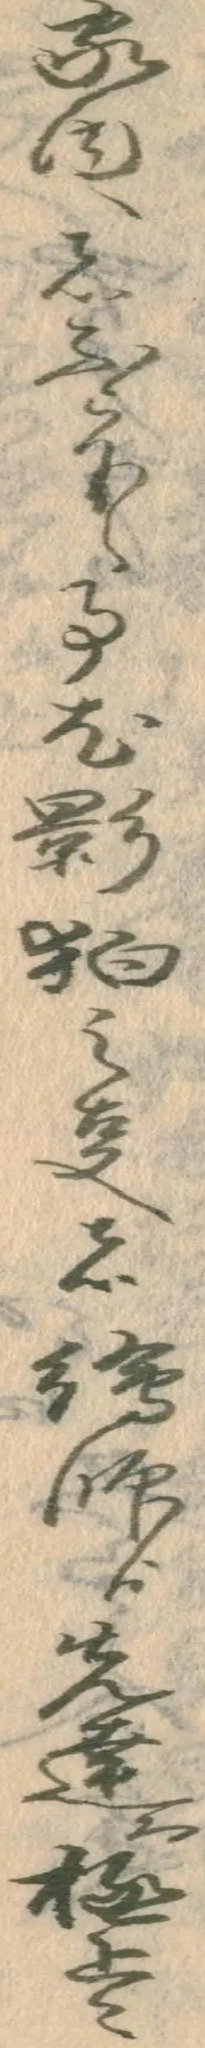家内へは不被下候事尤影狛之事は絵師ゟ先達而極上々
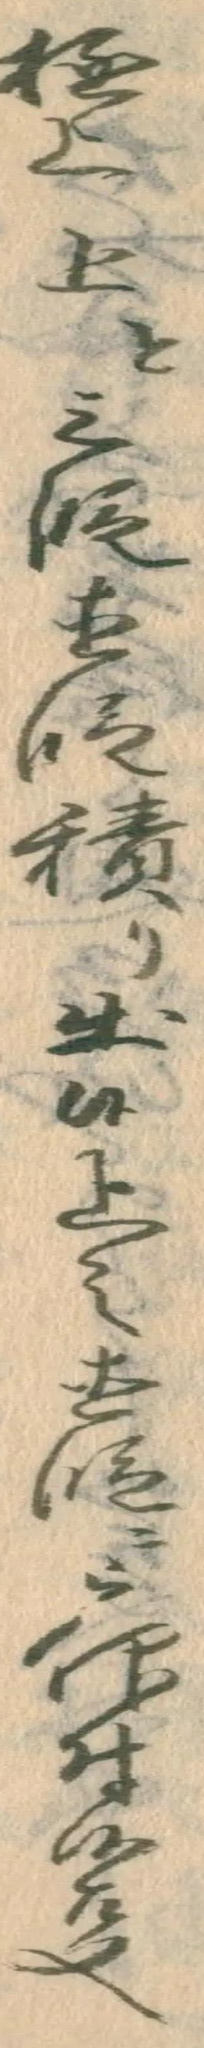極上上と三段直段積り出候上之直段ニ被仰付候事
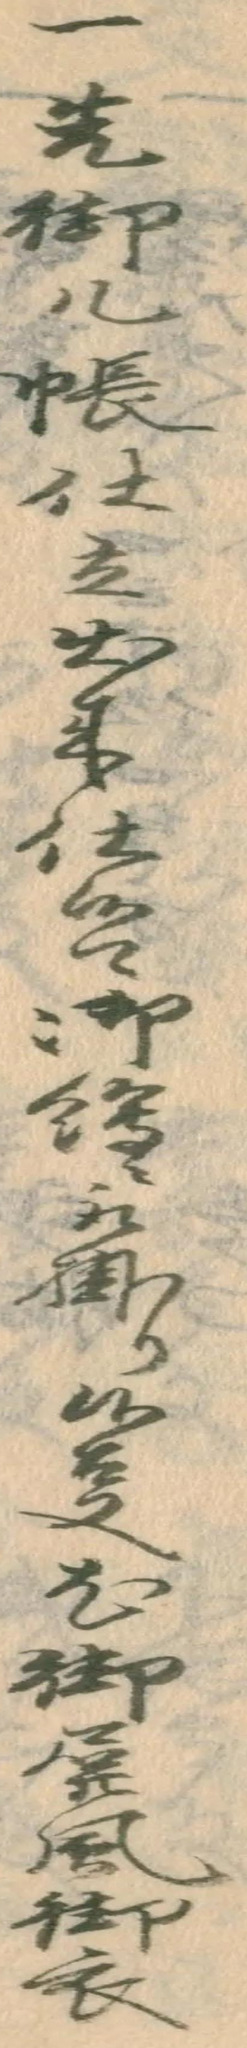一先御几帳仕立出来仕候ハヽ御絵取掛り候事尤御屏風御衣
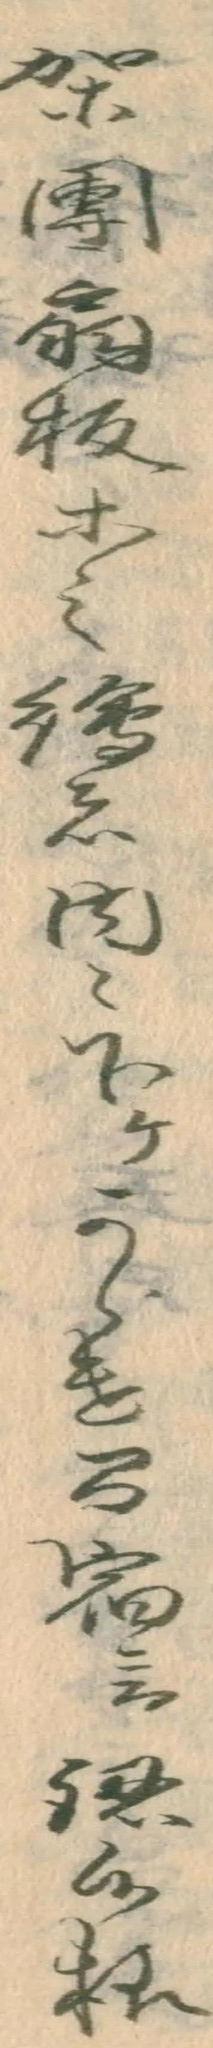架団扇板等之絵は内々下ケ可被遣間宿ニ而認候様
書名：賀茂社記録. 第17冊
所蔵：国立国会図書館 National Diet Library, JAPAN
